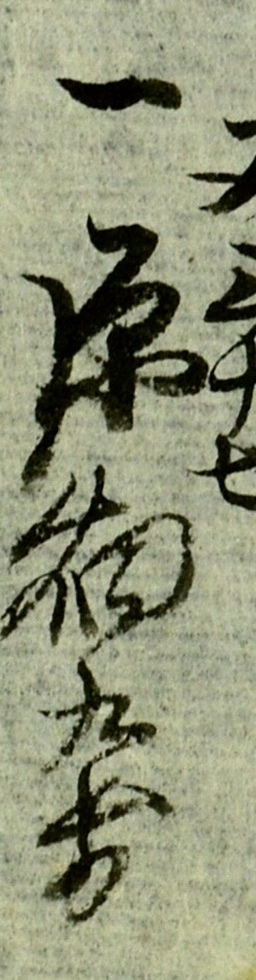一原畑九歩
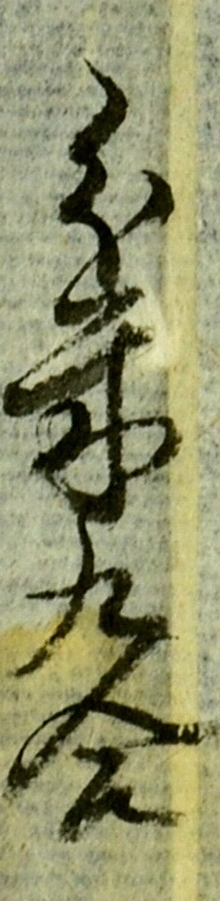分米九合
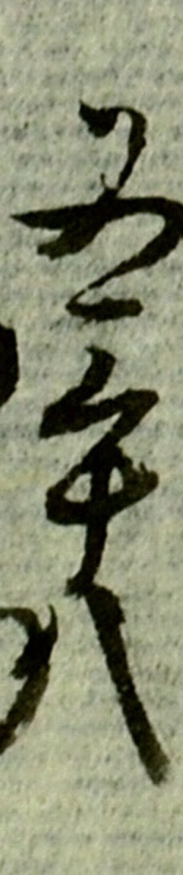五三十八
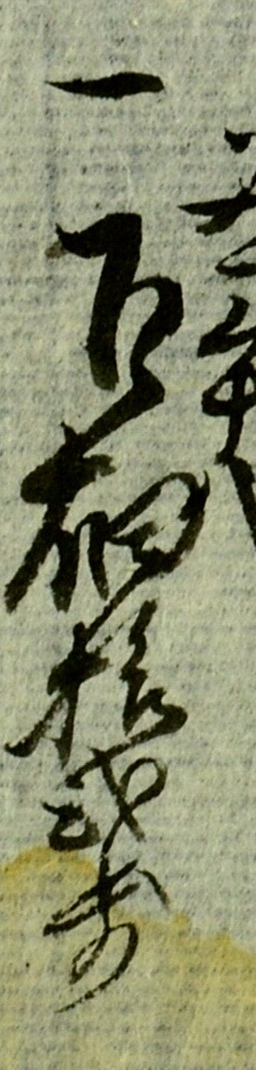一下々畑拾弐歩
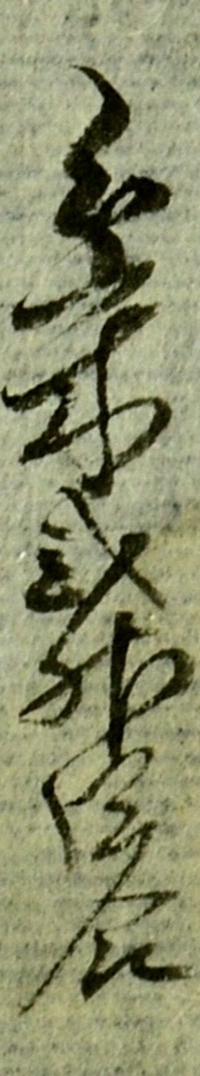分米弐升四合
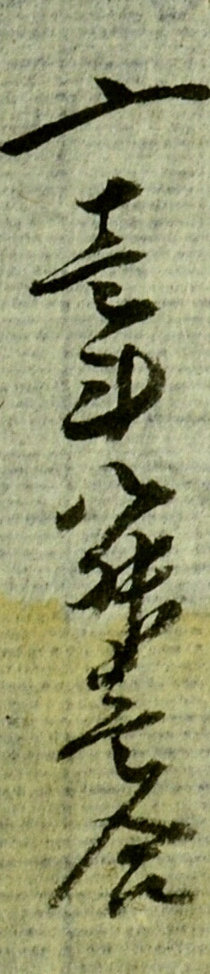〆壱斗八升壱合
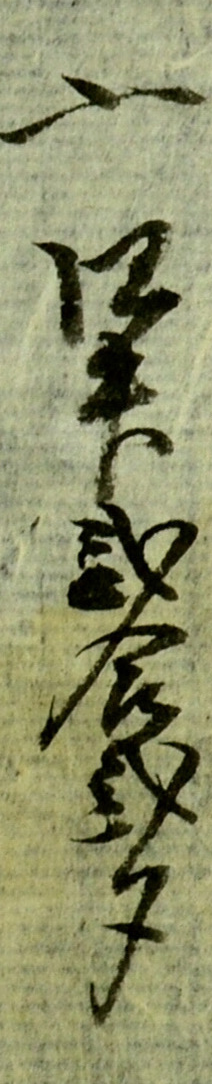〆四升弐合弐勺
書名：覚
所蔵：伊那市立高遠町図書館・合同会社AMANE
